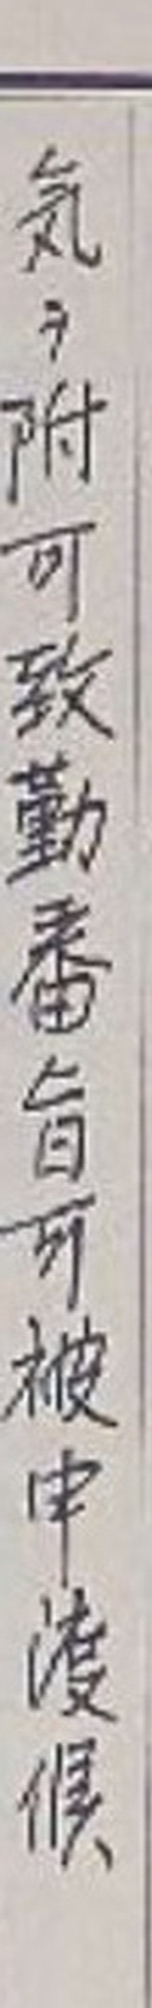気を附可致勤番旨可被申渡候
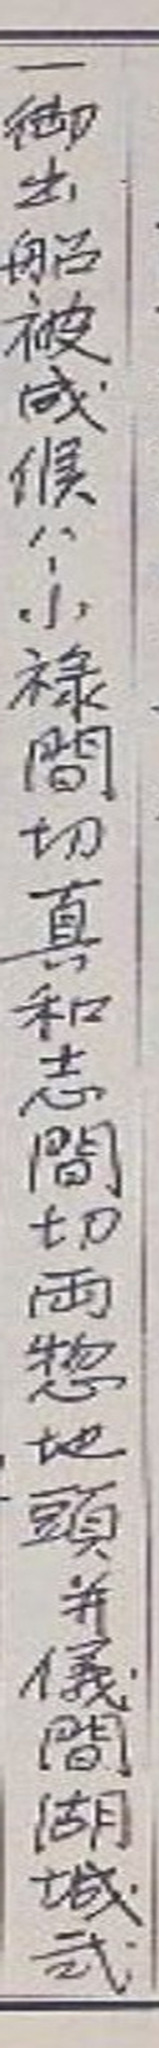一御出船被成候はゝ小禄間切真和志間切両惣地頭并儀間湖城弐
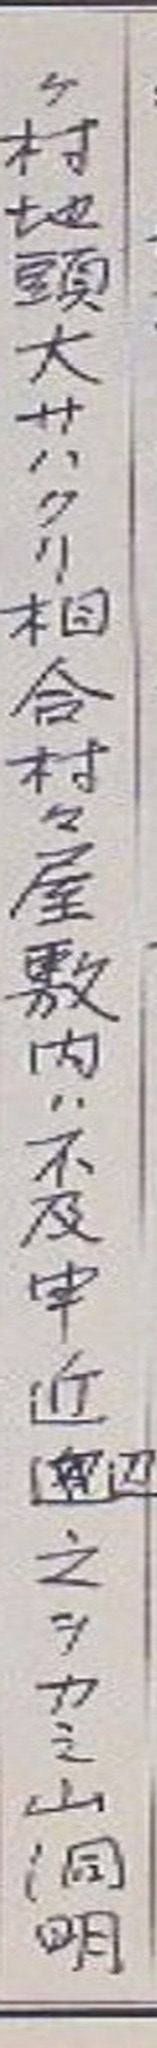ヶ村地頭大さはくり相合村々屋敷内は不及申近辺之をかみ山洞明
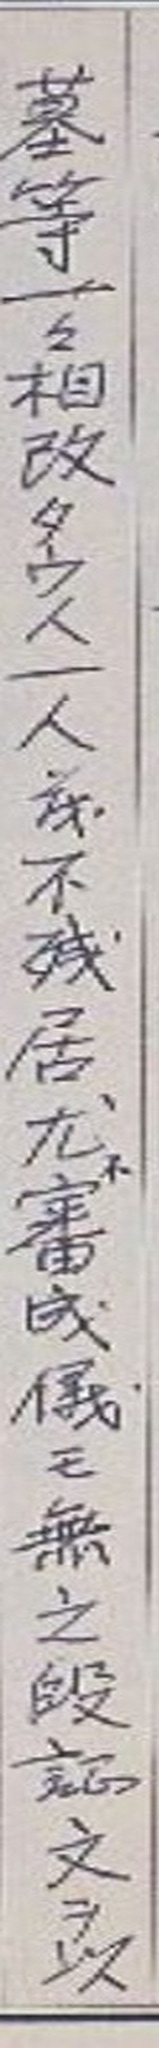墓等一々相改たう人一人も不残居尤不審成儀も無之段証文を以
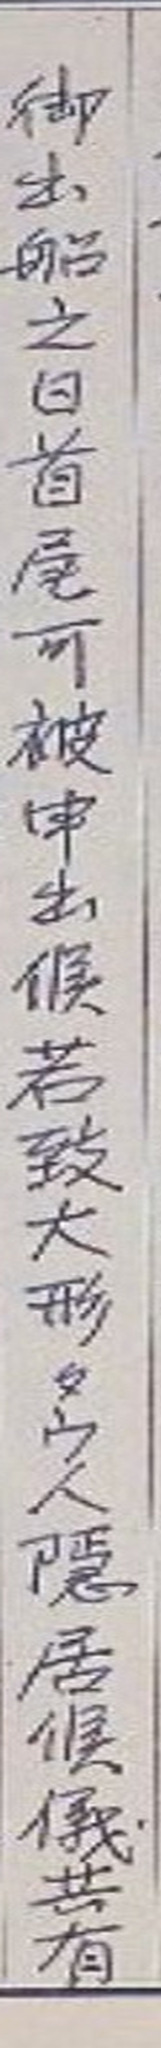御出船之日首尾可被申出候若致大形たう人隠居候儀共有
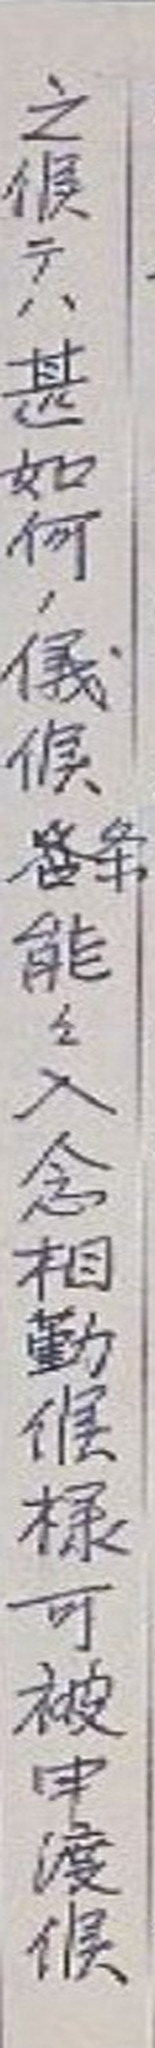之候ては甚如何の儀候条能々入念相勤候様可被申渡候
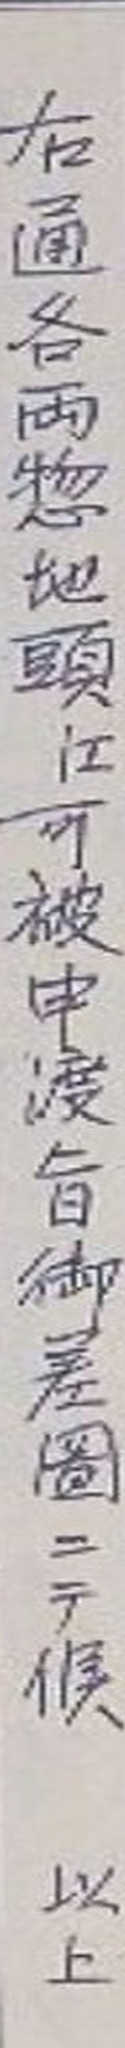右通各両惣地頭え可被申渡旨御差図にて候以上
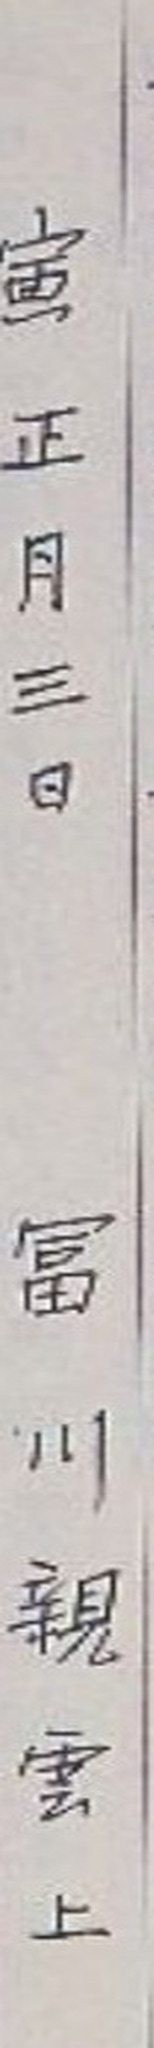寅正月三日冨川親雲上
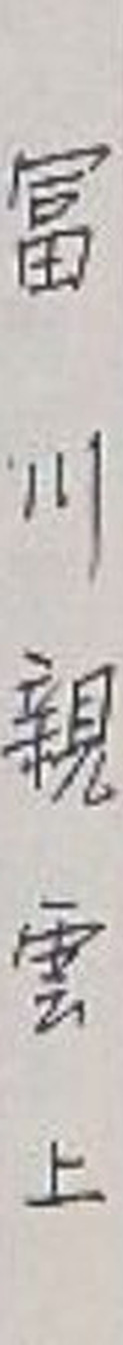冨島親雲上
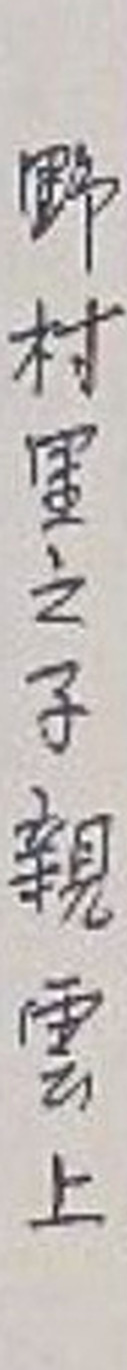野村里之子親雲上
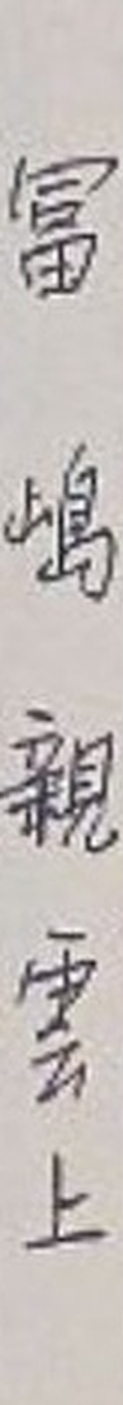冨島親雲上
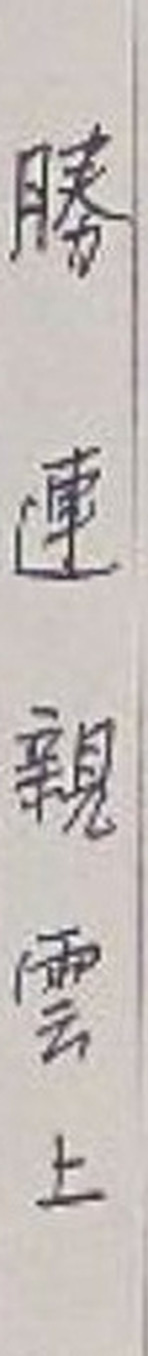勝連親雲上
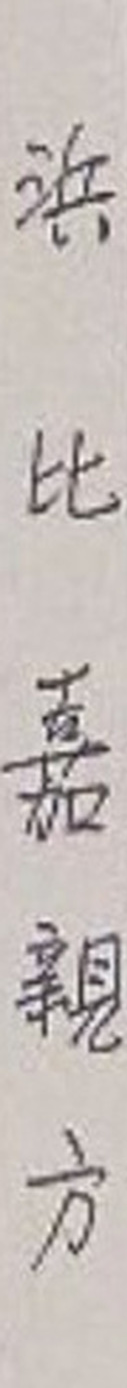浜比嘉親方

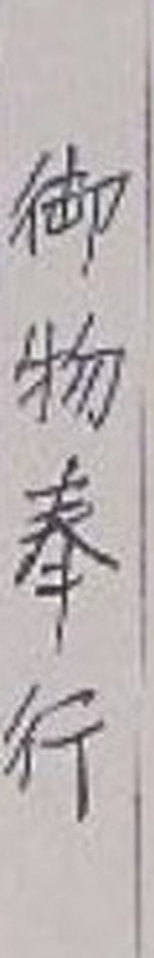御物奉行
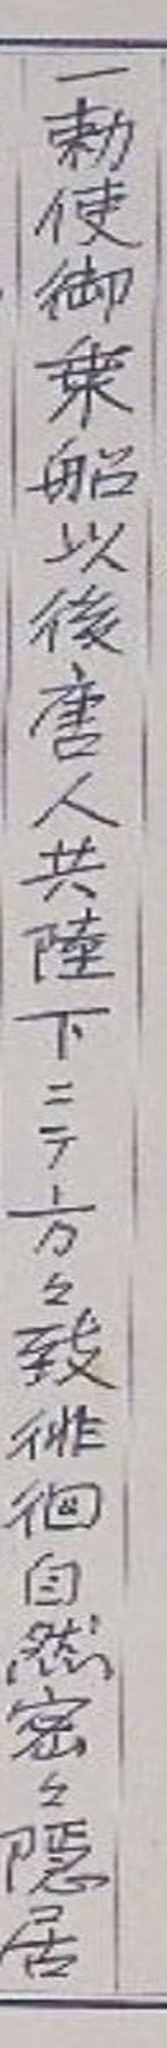一勅使御乗船以後唐人共陸下にて方々致徘徊自然密々隠居
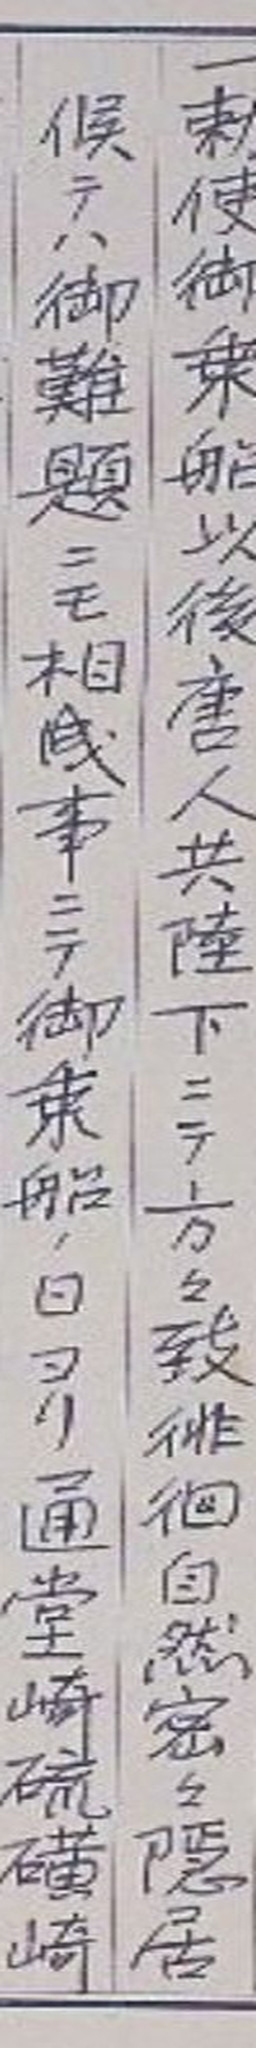候ては御難題にも相成事にて御乗船の日より通堂崎硫磺崎
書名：支那冊封使来琉諸記 下巻
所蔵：University of the Ryukyus Library
